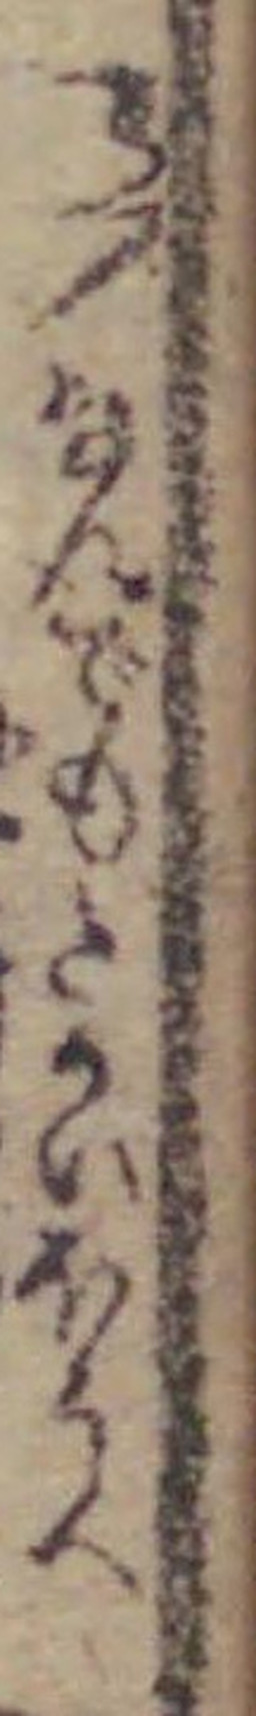なんでもたかいほうへ
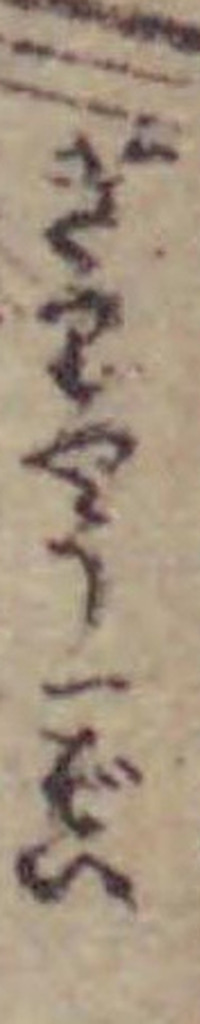ぎりやう一ばい
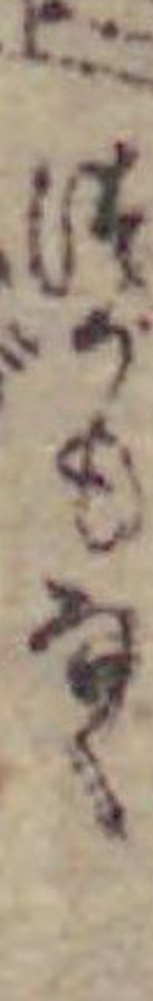つがもなく
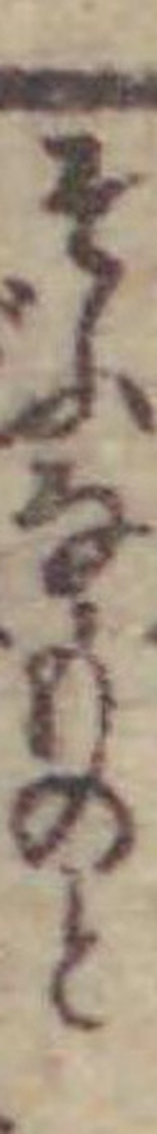そふなものと
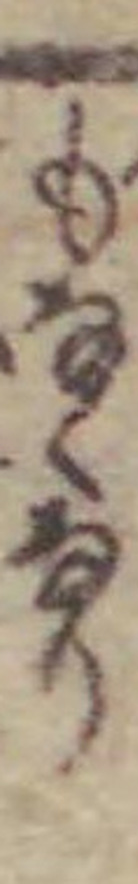もなくなり
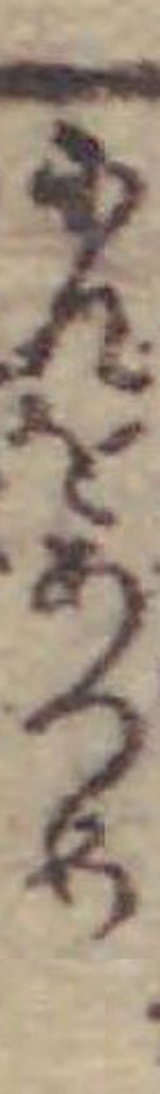にんをあつめ
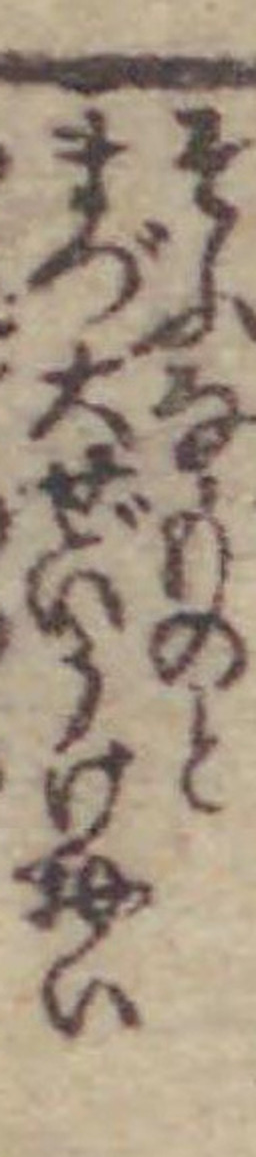まづ大ぜいうけおい
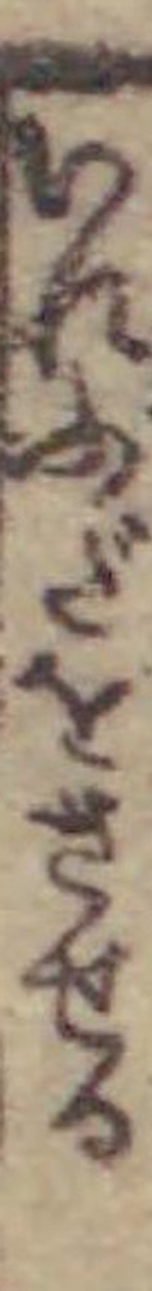いれふだをさせる

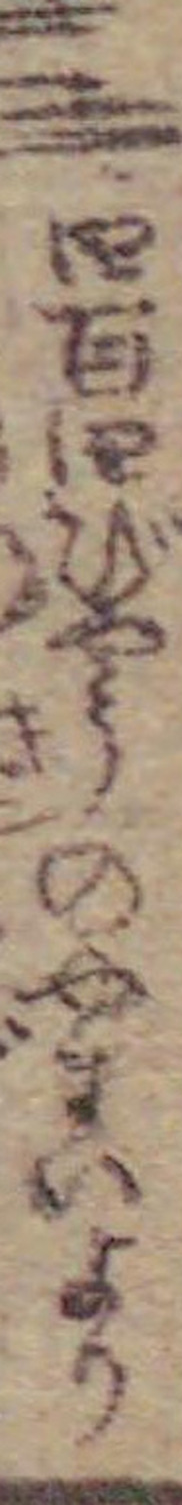四百四びやうのやまいより
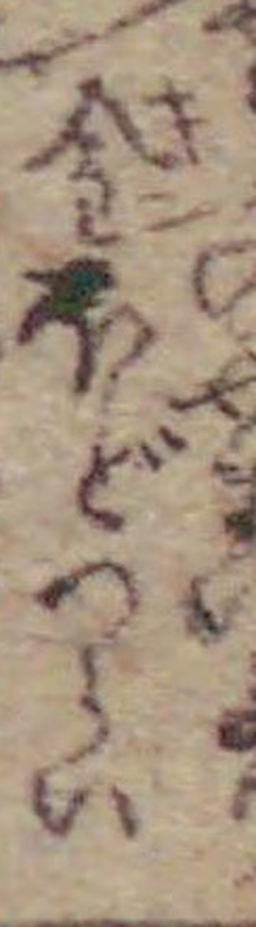金ほどつらい
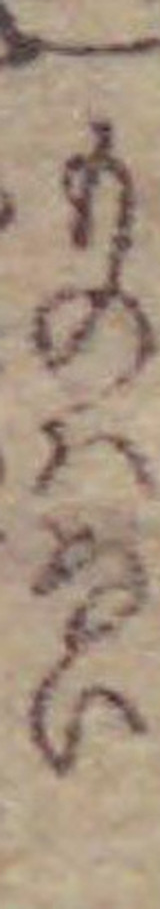ものはない
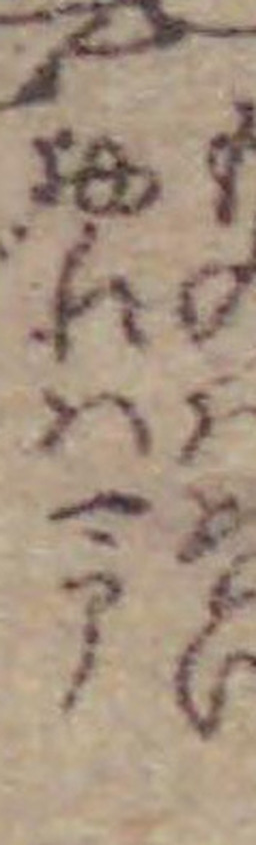おれはマア
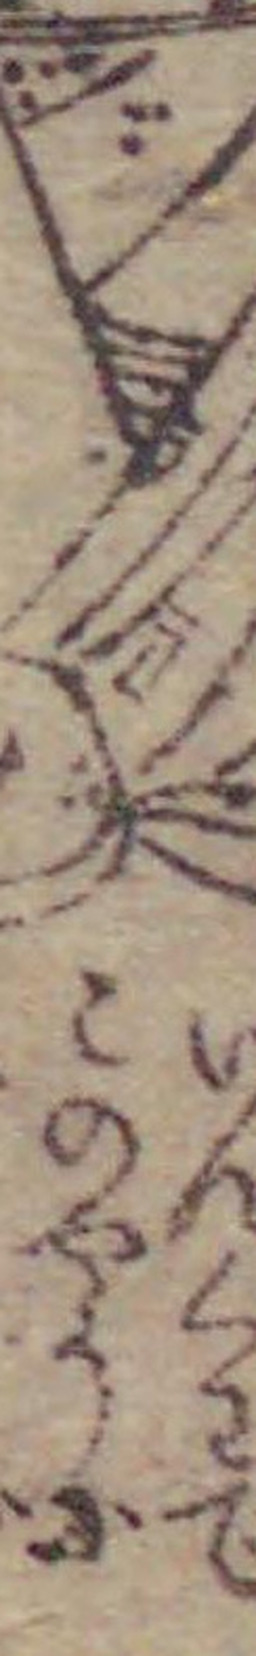このやうに
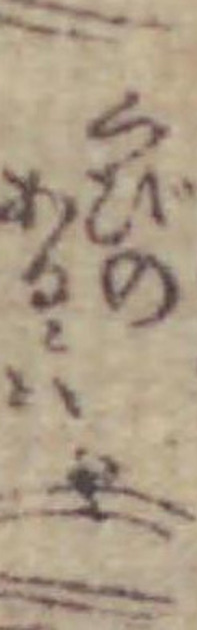あるには
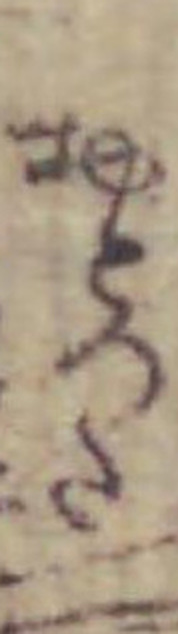おとつた
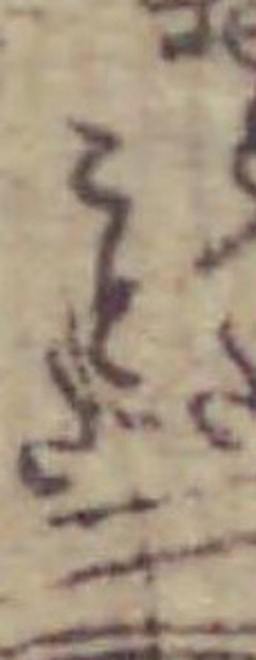ことだ
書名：莫切自根金生木 : 3巻
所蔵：国立国会図書館 National Diet Library, JAPAN
